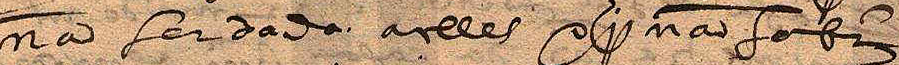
não ser dada a elles e p̄o não sabr̄
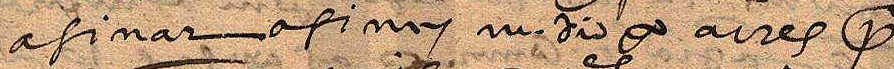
asinar asiney eu diogo aires p̄o
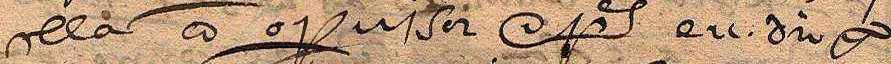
ella c̄o o ꝓujsor e pes eu. diogo
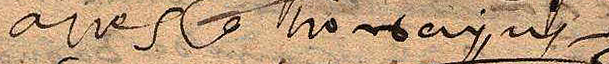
ajres q̄ ho escryuj
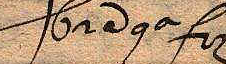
brāqa frz̄
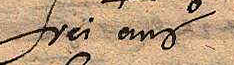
frei anto
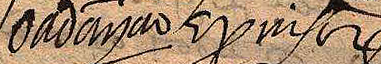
o adayão E ꝓuisor
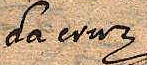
da cruz
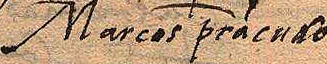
Marcos prācudo
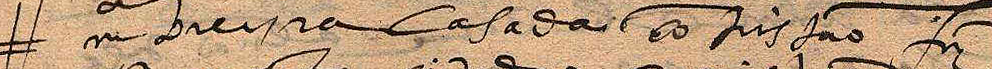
item ma vieyra Casada c̄o tristão frz̄
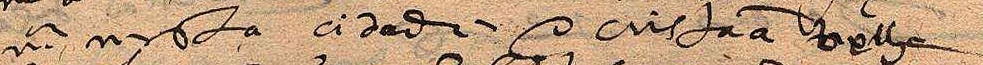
mor nesta çidade e cristaā velha
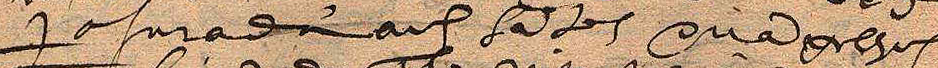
ta Jurada aos sātos euāgelhos
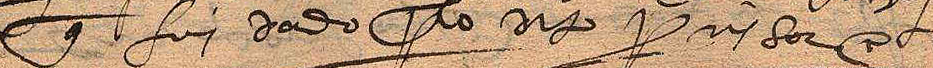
q̄ foj dado p̄lo dito ꝓujsor ē
